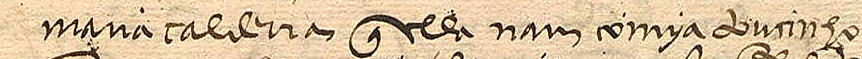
maria caldeira q̅ ella nam comya toucinho
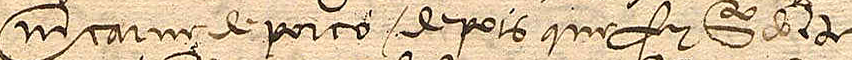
nē carne de porco / depois que foy mto doe̅te
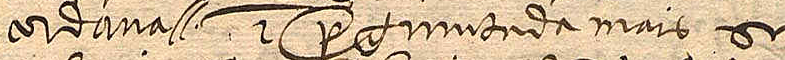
cordaua //. item p̄gumtada mais se
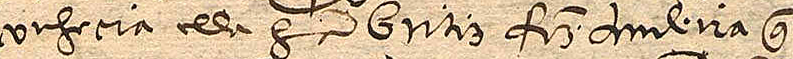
conhecia ella hūa britiz frz temdeira q̅
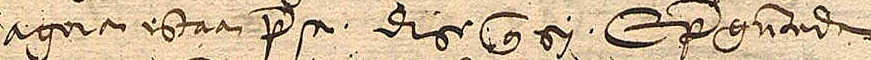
agora estaa p̄sa dise q̅ sy. E p̄gu̅tada
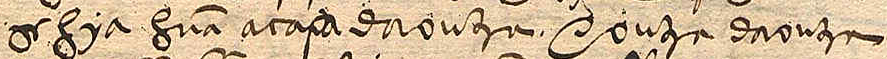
se hya hu̅a a casa da outra e outra da outra
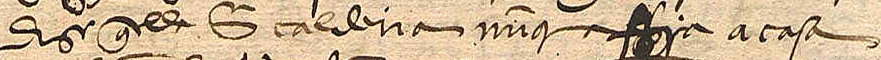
dise q̅ ella m̄a caldeira nu̅qua ffora a casa
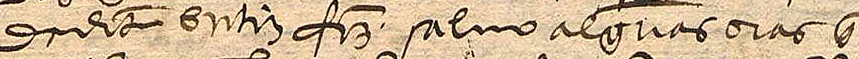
da dit̅a britiz fr̅z saluo algūas oras q̅
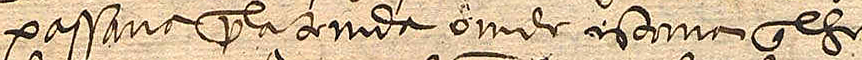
passaua p̄la temda omde estaua q̅ lhe
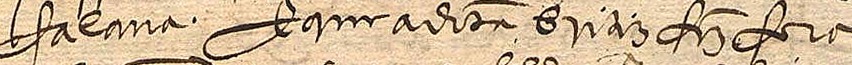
falaua. E que a dit̅a britiz fr̅z fora
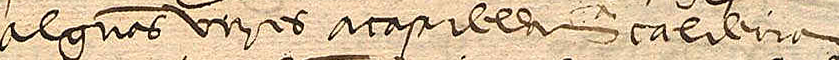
algu̅as vezes a casa della ma caldeira
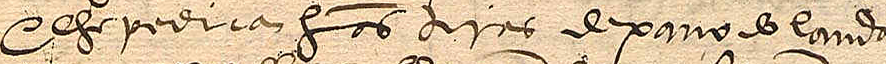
e lhe pedira hu̅as tiras de pano dolanda
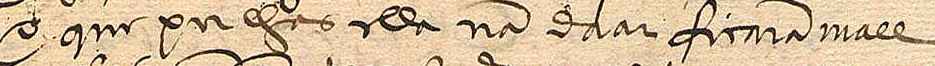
e que por lhas ella na̅ daar ficara̅ mall
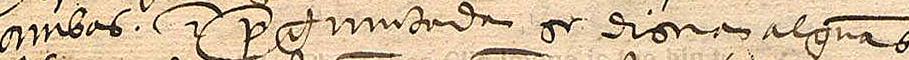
ambas. item p̄gumtada se disera algu̅as
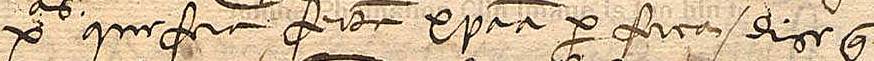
pas que fora feit̅a xpa̅a ꝑ força / dise q̅
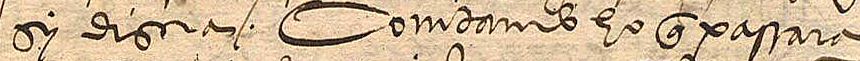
sy disera /. Comtamdo ho q̅ passara
